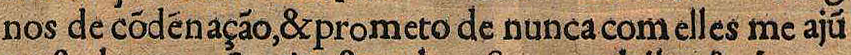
nos de cōdēnação, & prometo de nunca com elles me ajū
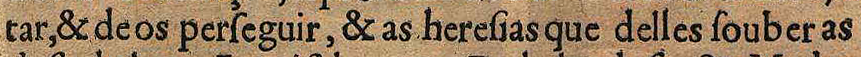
tar, & de os perseguir, & as heresias que delles souber as
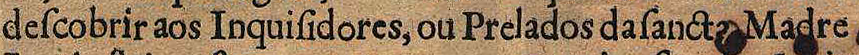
descobrir aos Inquisidores, ou Prelados da sancta Madre
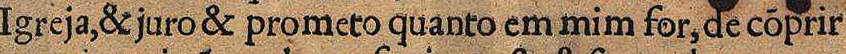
Igreja, & juro & prometo quanto em mim for, de cōprir
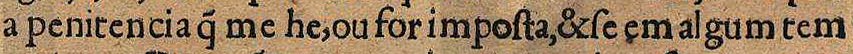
a penitencia q̄ me he, ou for imposta, & se em algum tem
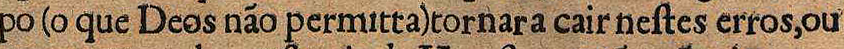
po (o que Deos não permitta) tornar a cair nestes erros, ou
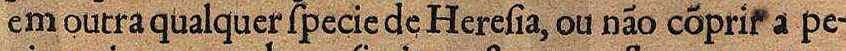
em outra qualquer specie de Heresia, ou não cōprir a pe
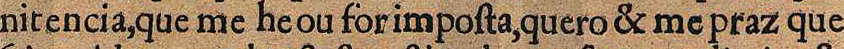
nitencia, que me he ou for imposta, quero & me praz que
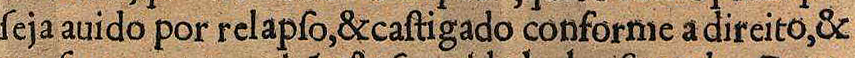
seja auido por relapso, & castigado conforme a direito, &
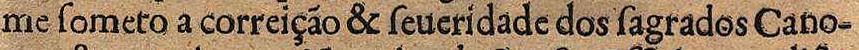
me someto a correição & seueridade dos sagrados Cano
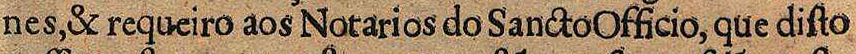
nes, & requeiro aos Notarios do Sancto Officio, que disto
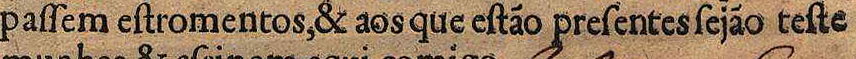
passem estromentos, & aos que estão presentes sejão teste
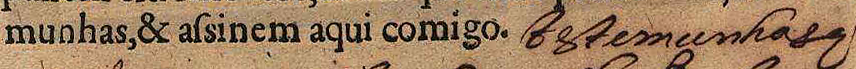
munhas, & assinem aqui comigo. testemunhas q̄
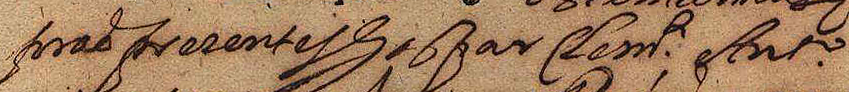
foraõ prezentes Gaspar Clem.t Ant.o
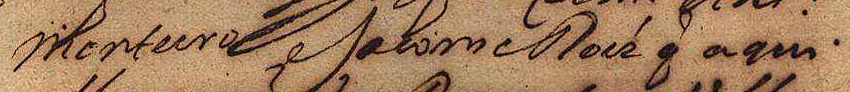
Monteiro e Jacome Roiz̄ q̄ aqui
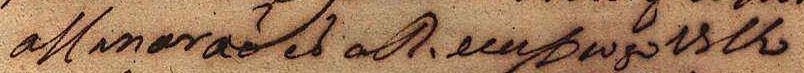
assinaraõ cō a R. e eu Diogo Velho
